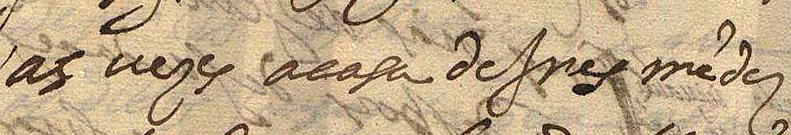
as uezes a casa de Jnes mēdez
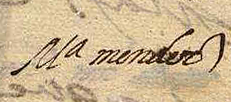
Ma mendez
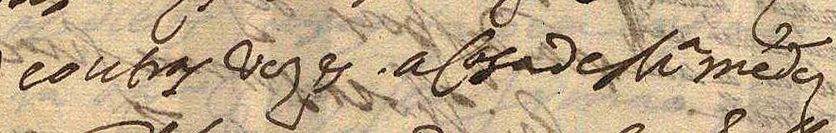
e outras vezes a Casa de Ma mēdez
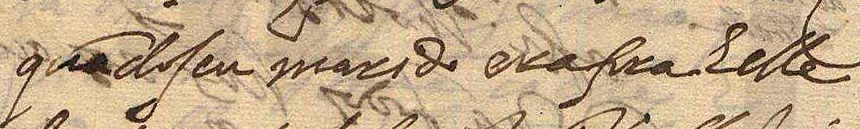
quādo seu marido era fora E elle
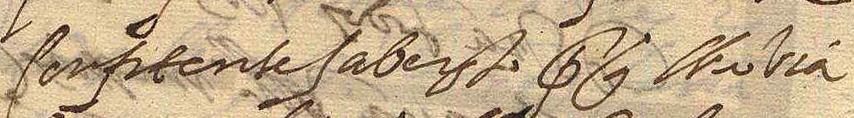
Confitente sabe isto p̄ q̄ lho via
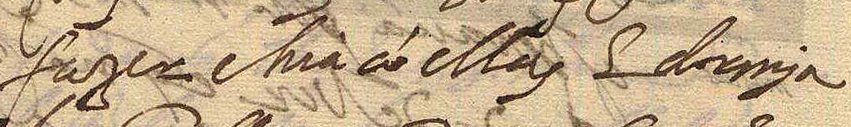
fazer e hia cō ellas E dormja
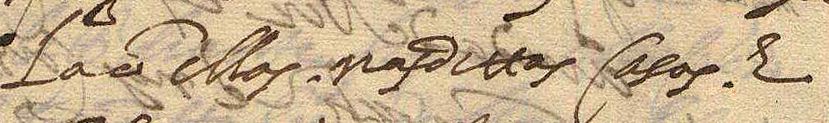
La cō ellas nas dittas Casas. E
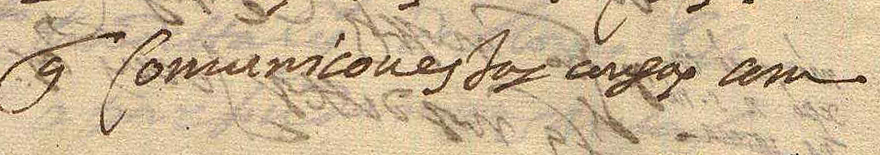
q̄ Comunicou estas cousas com
